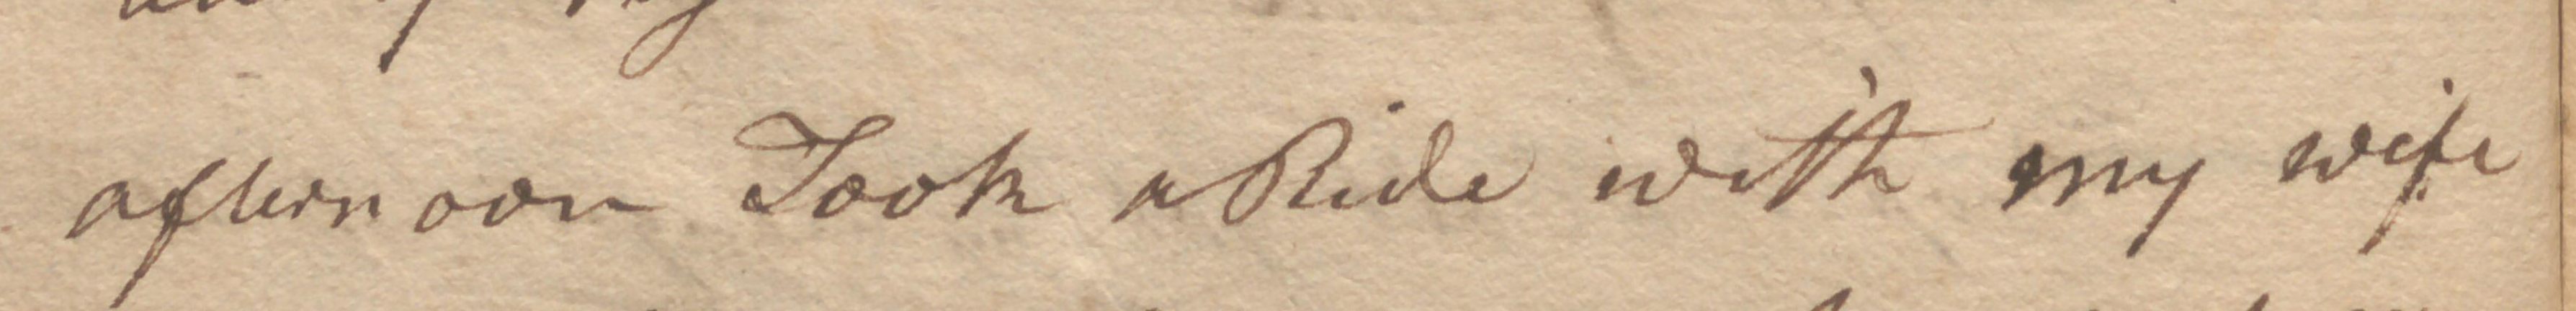afternoon Took a Ride with my wife
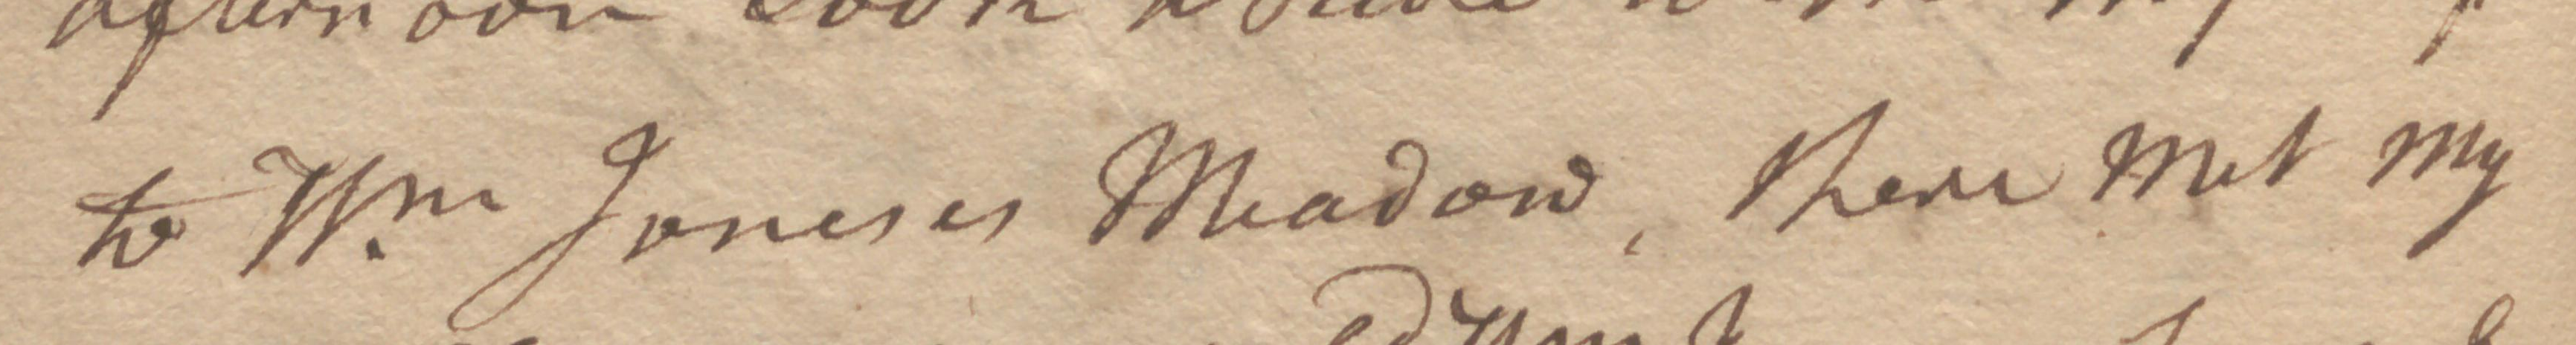to W^m. Joneses Meadow, there met My
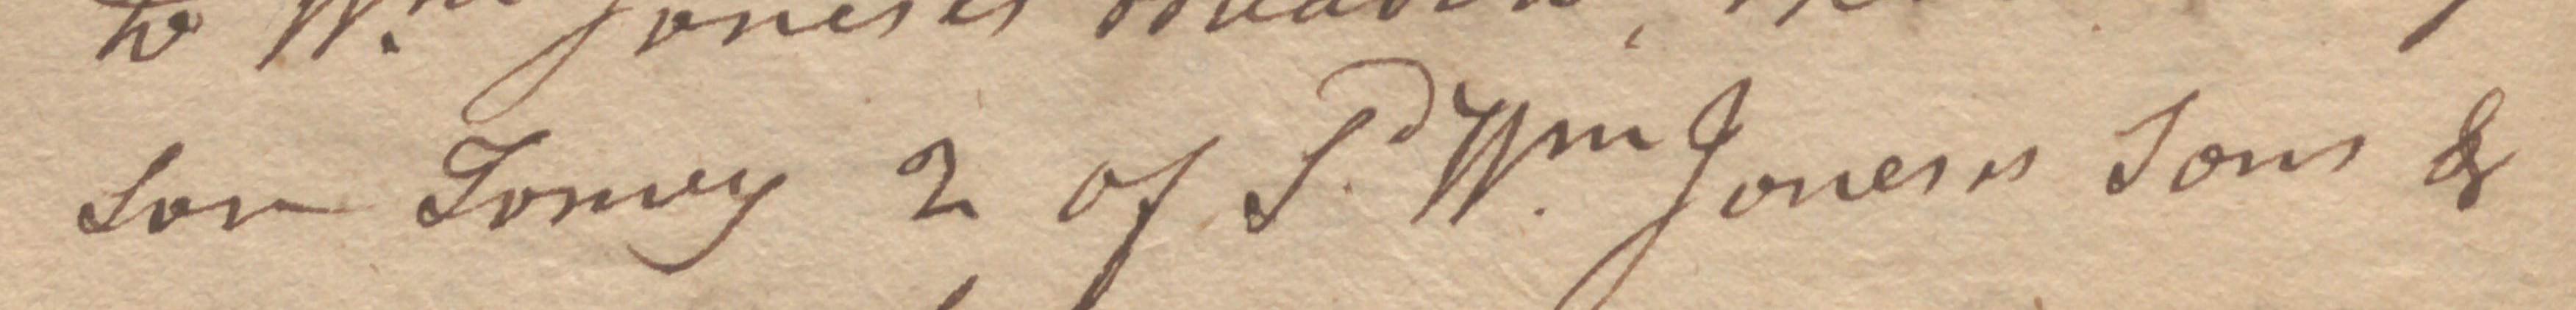son Tomey 2 of s^d. W^m. Joneses sons &
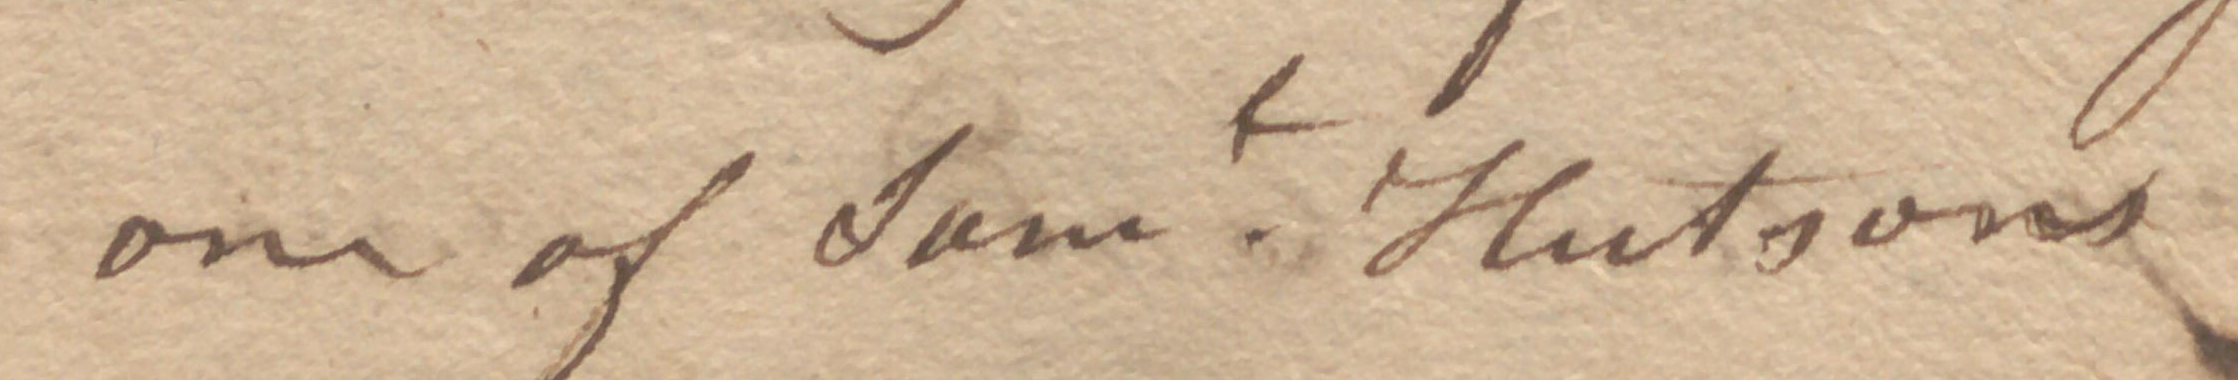one of Sam^l. Hutsons
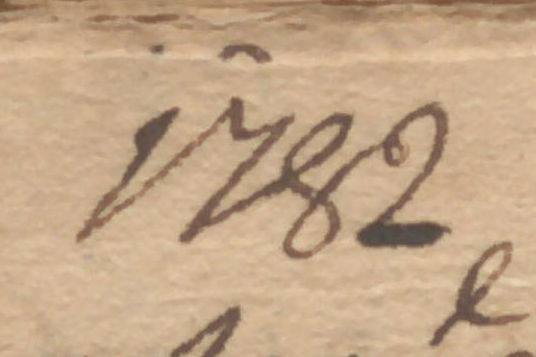1782
